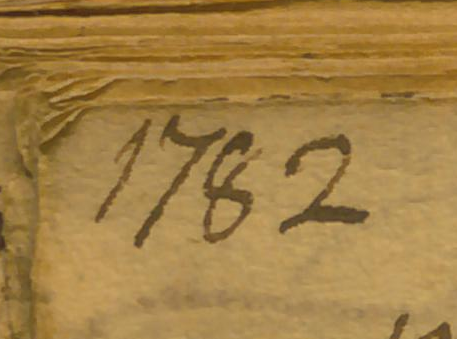1782
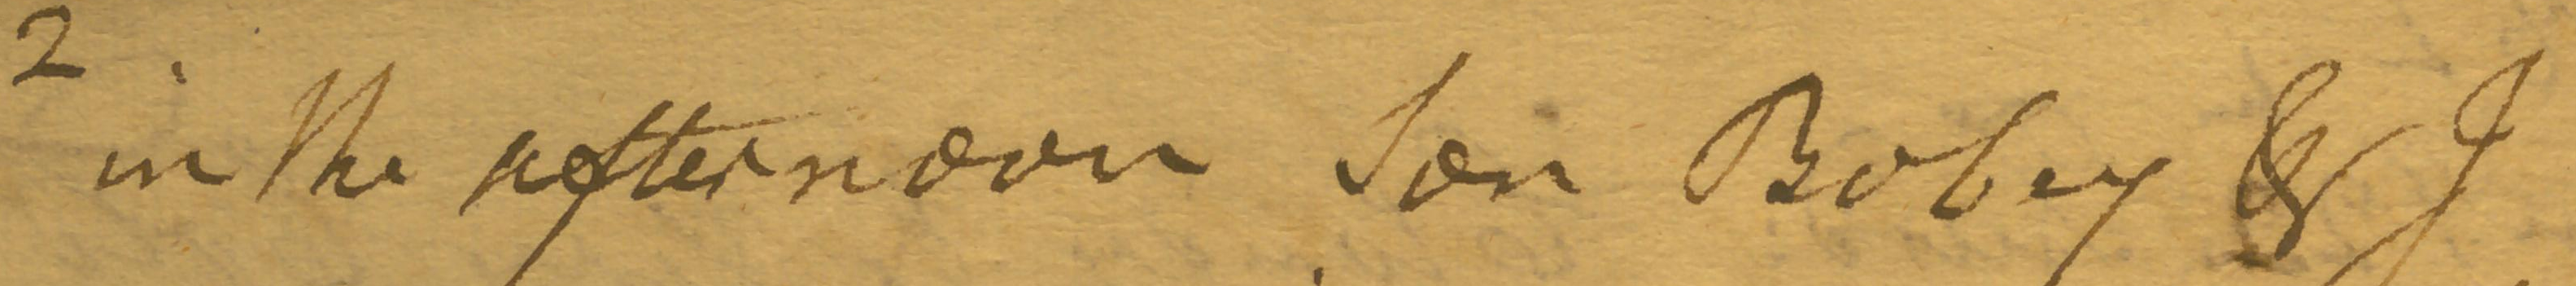in the afternoon son Bobey & I
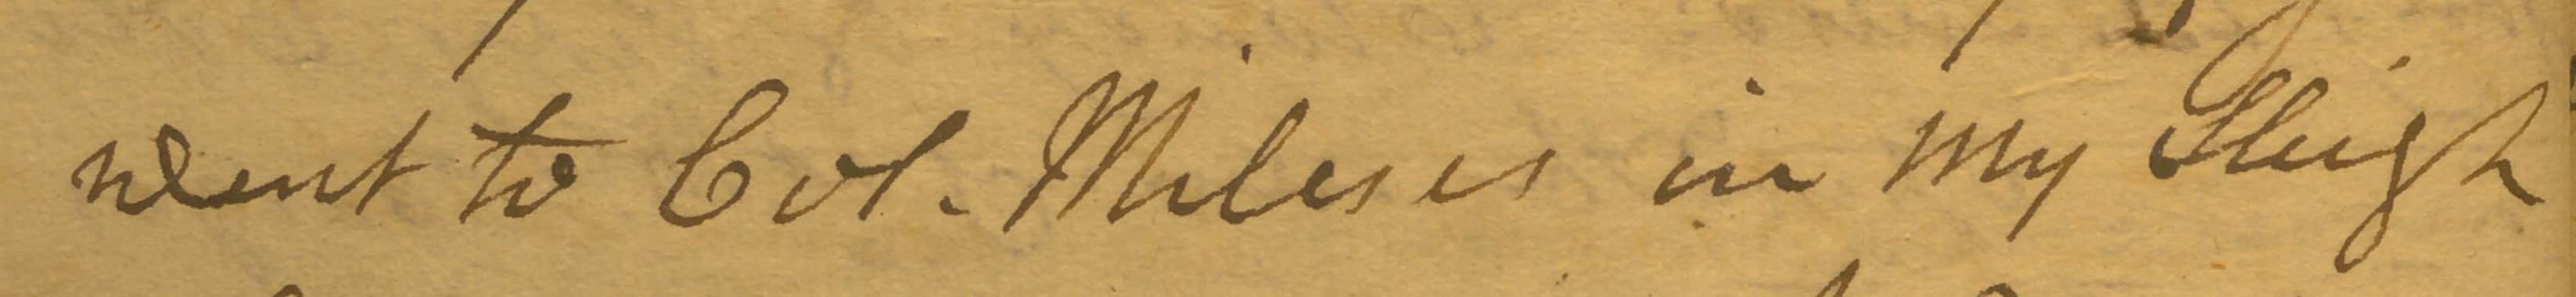went to Col. Mileses in My Sleigh
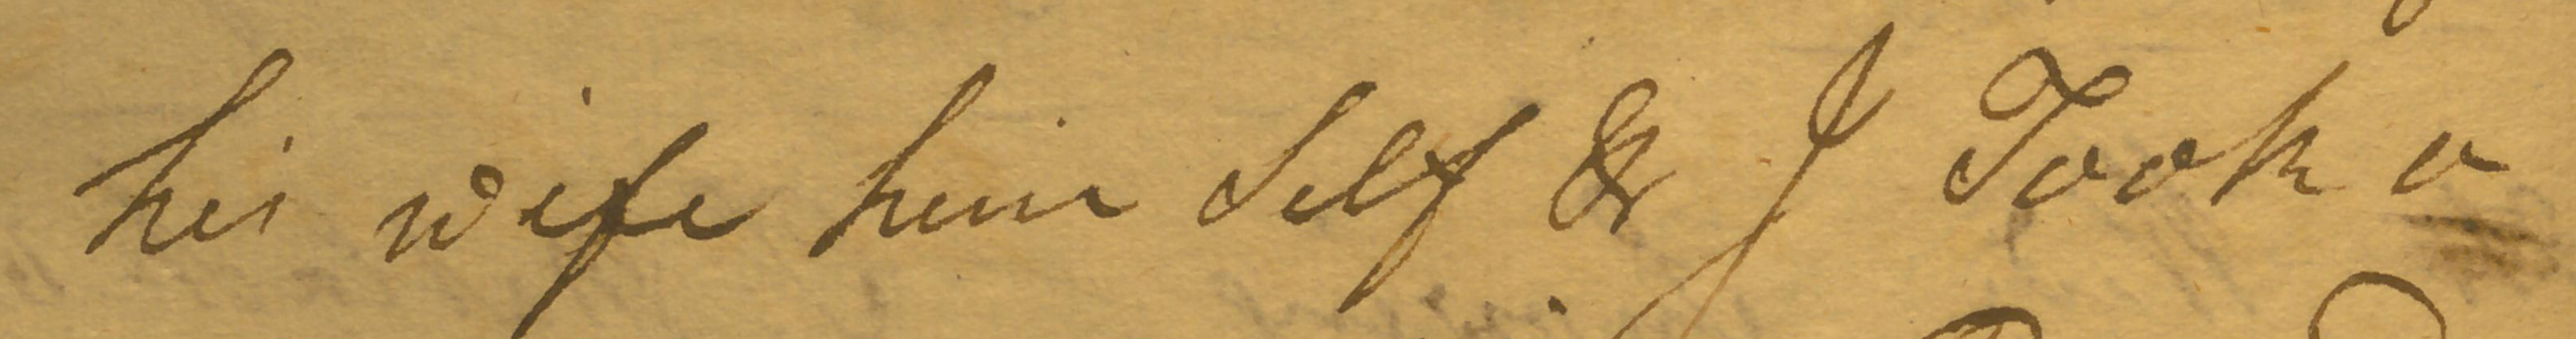his wife him self & I Took a
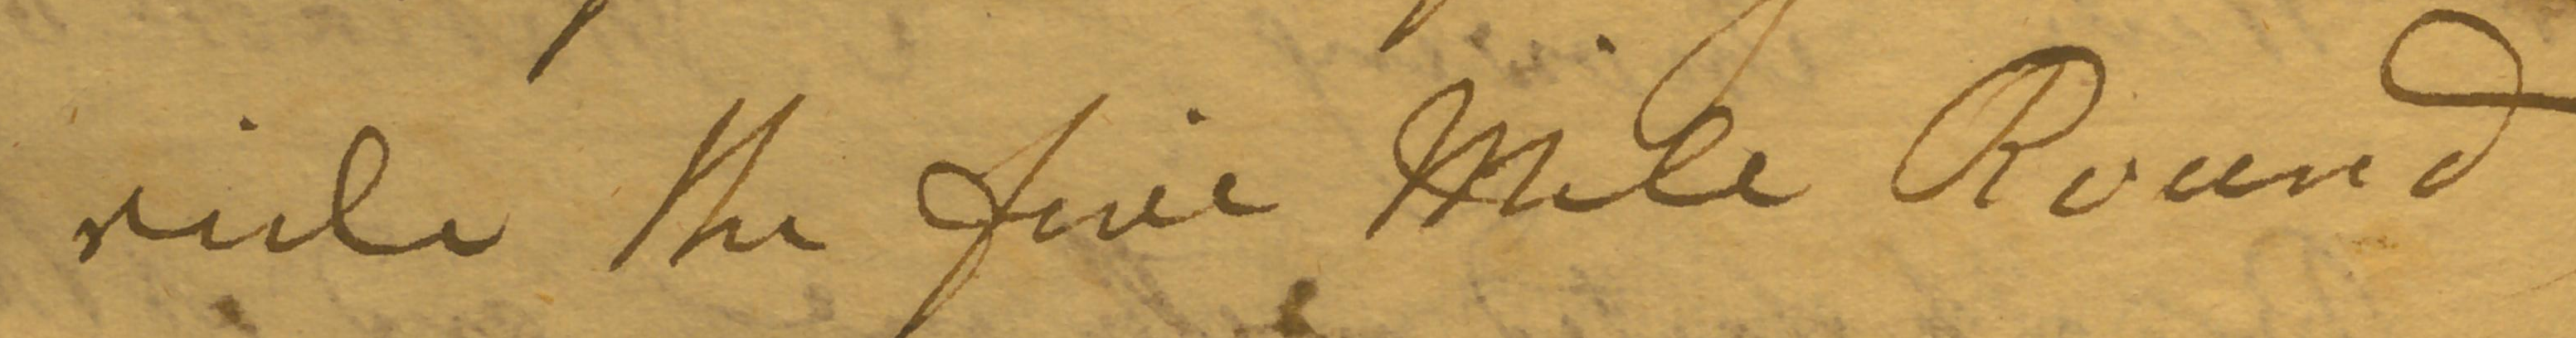ride the five Mile Round
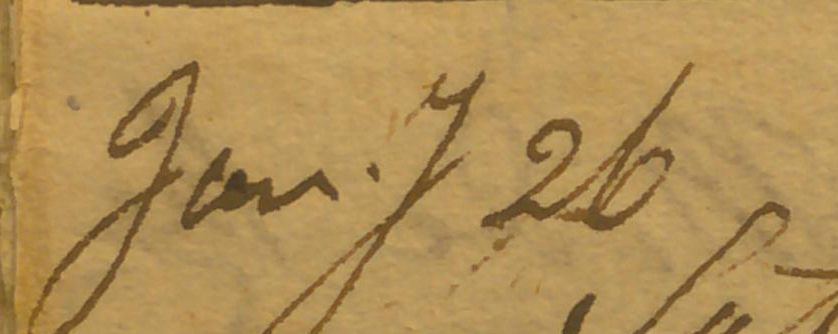Jan^y. 26
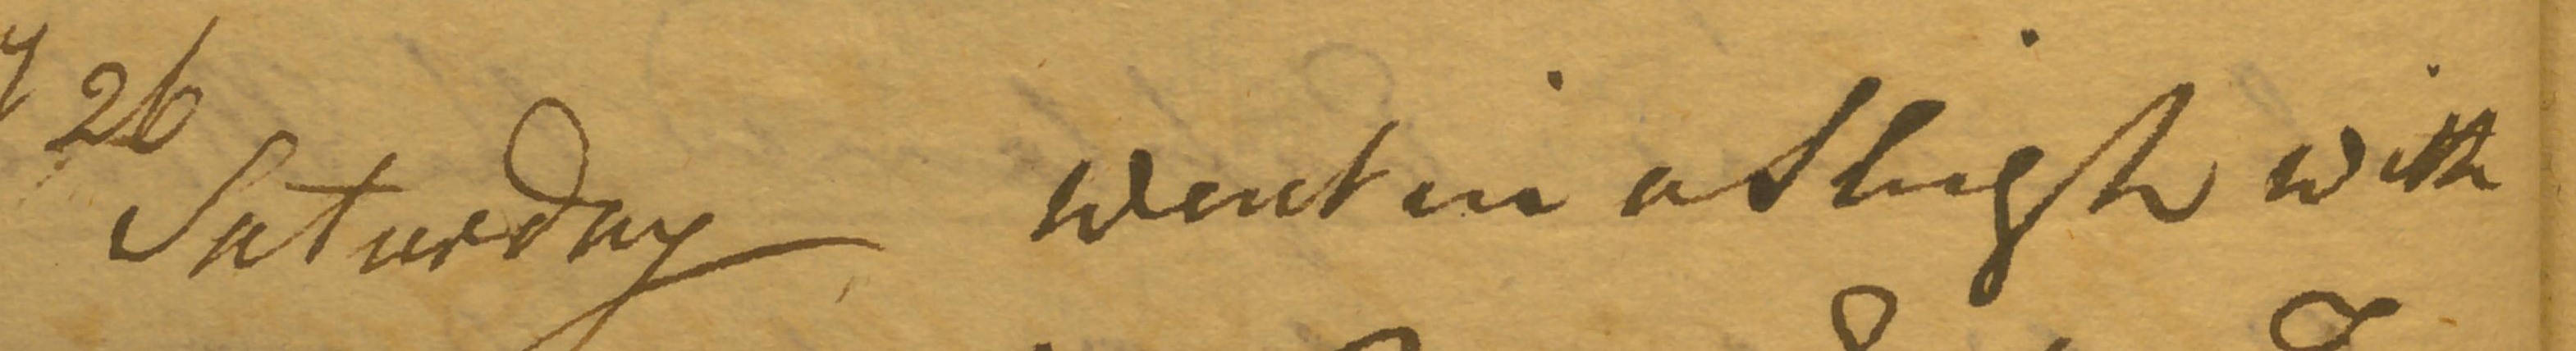Saturday went in a sleigh with
